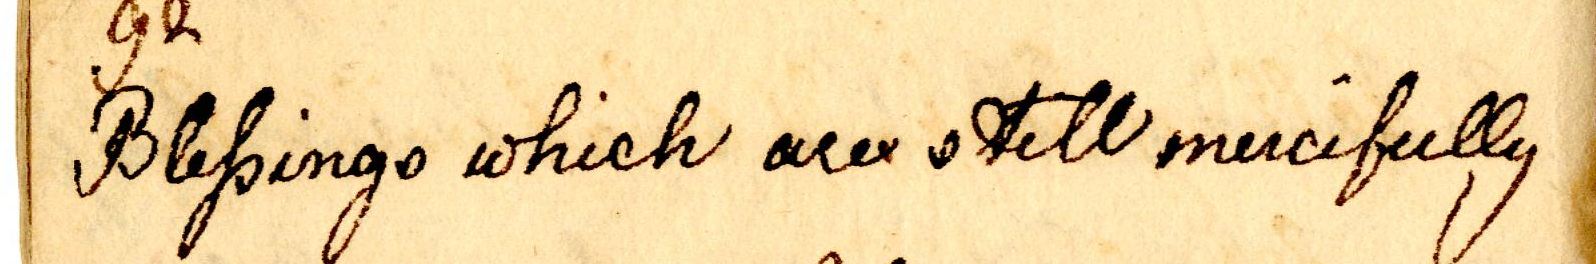Blessings which are still mercifully
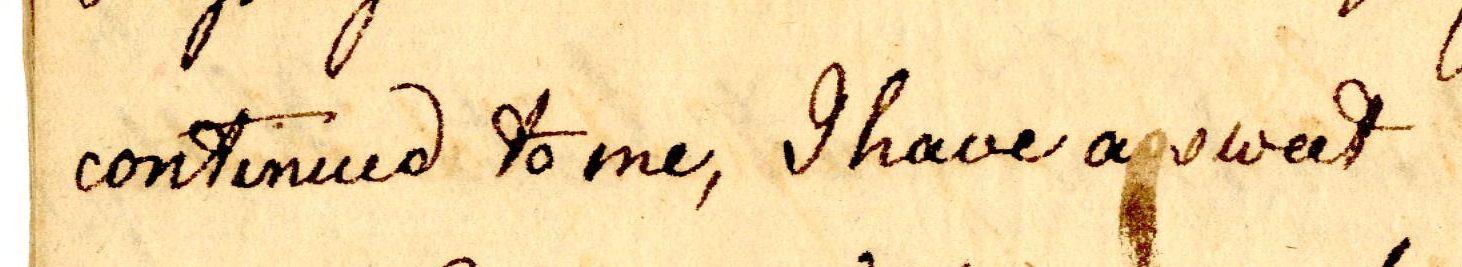continued to me, I have a sweet
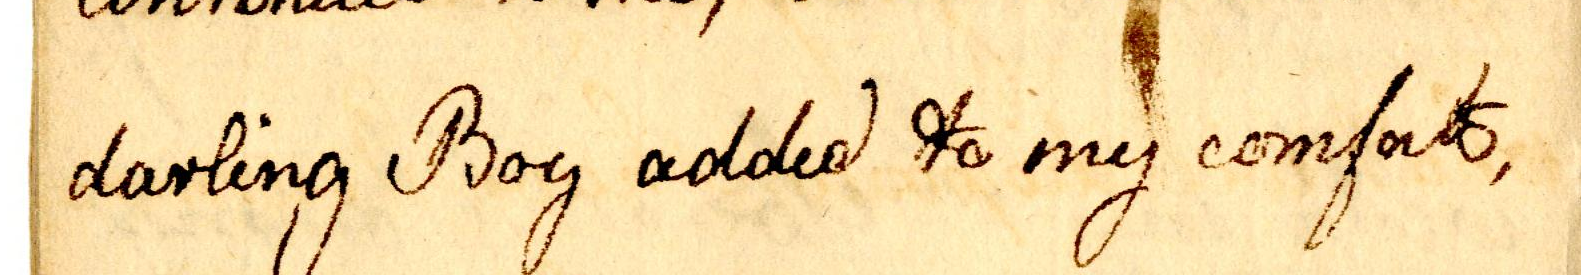darling Boy added to my comforts,
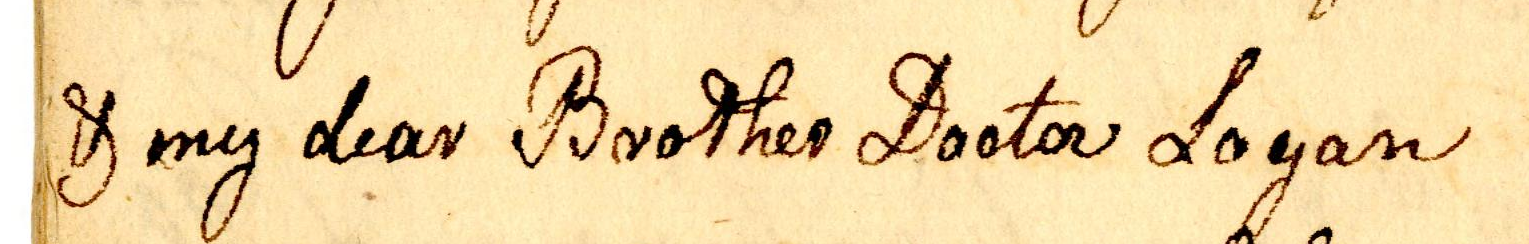& my dear Brother Doctor Logan
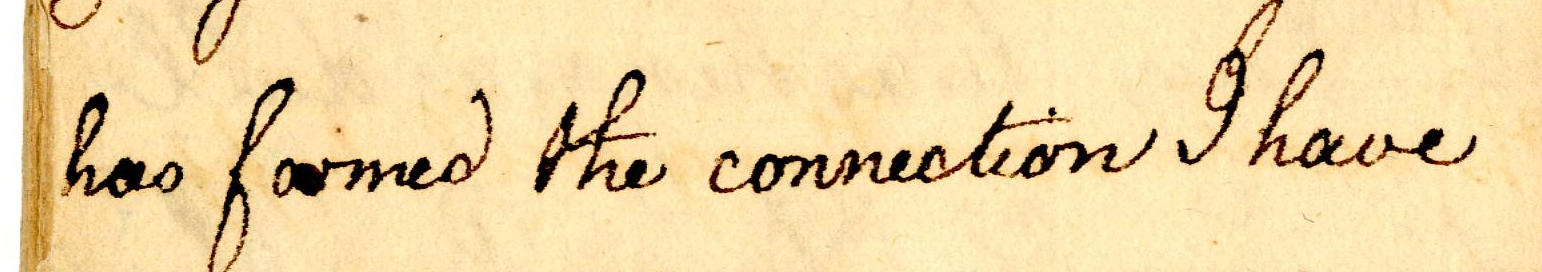has formed the connection I have
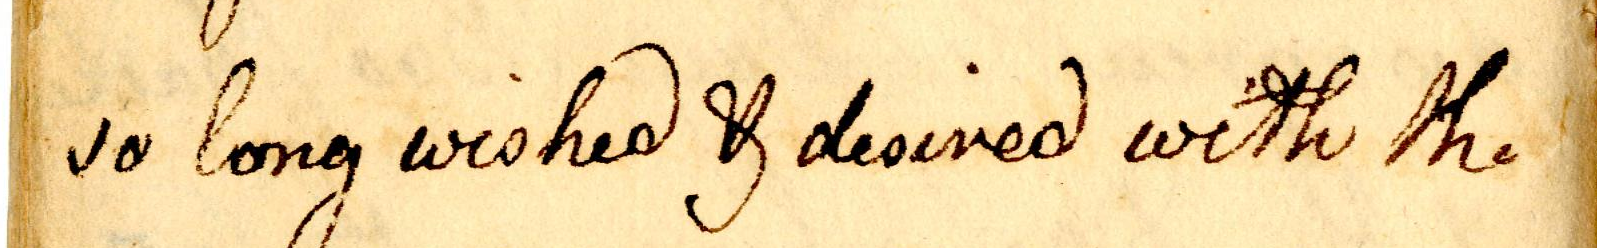so long wished & desired with the
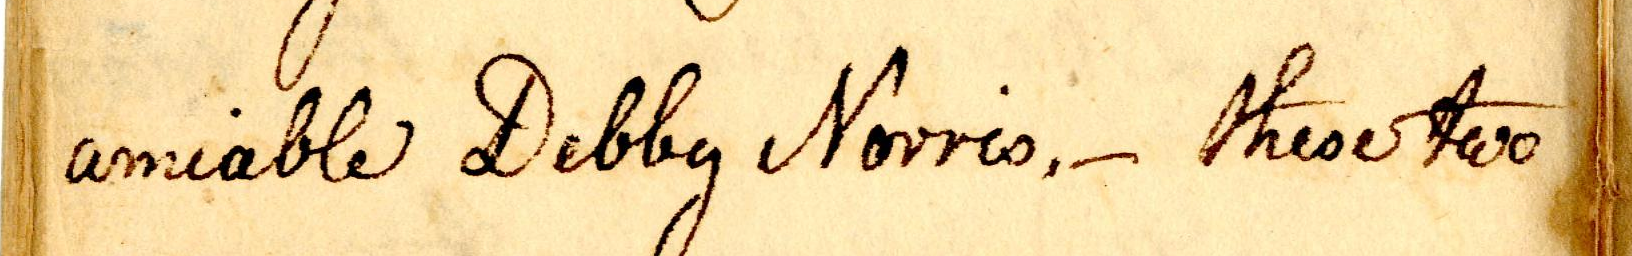amiable Debby Norris- these two
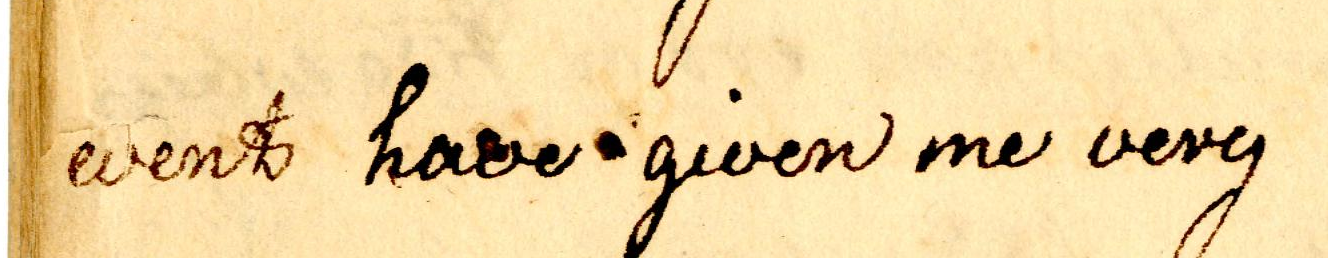events have given me very
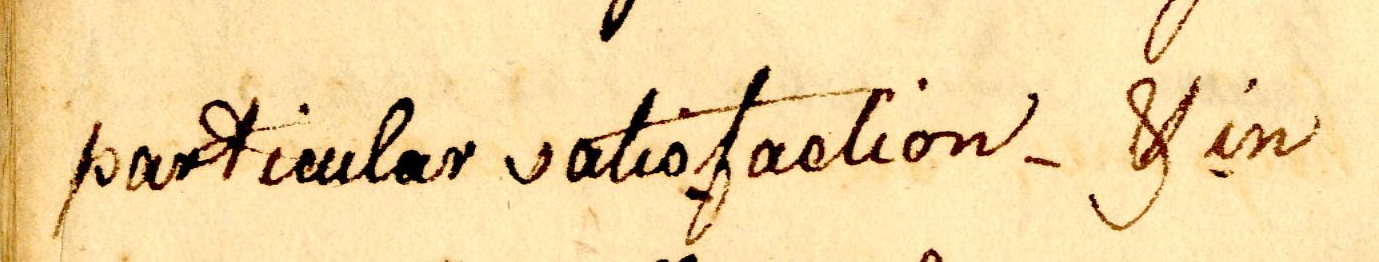particular satisfaction- & in
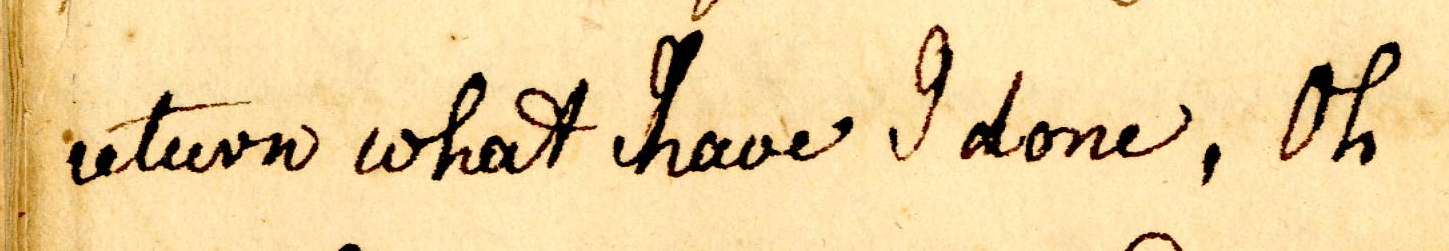return what have I done, Oh
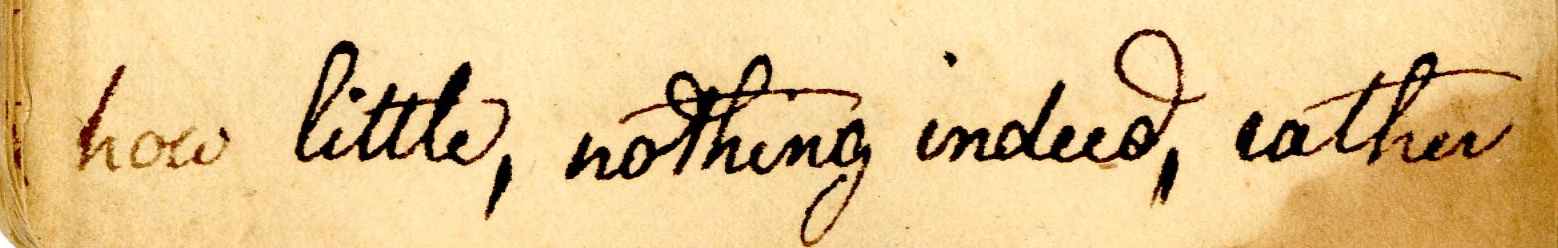how little, nothing indeed, rather
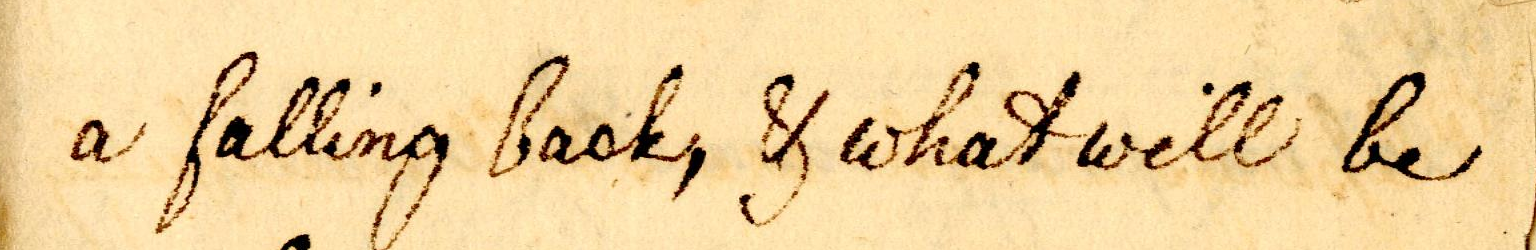a falling back, & what will be
